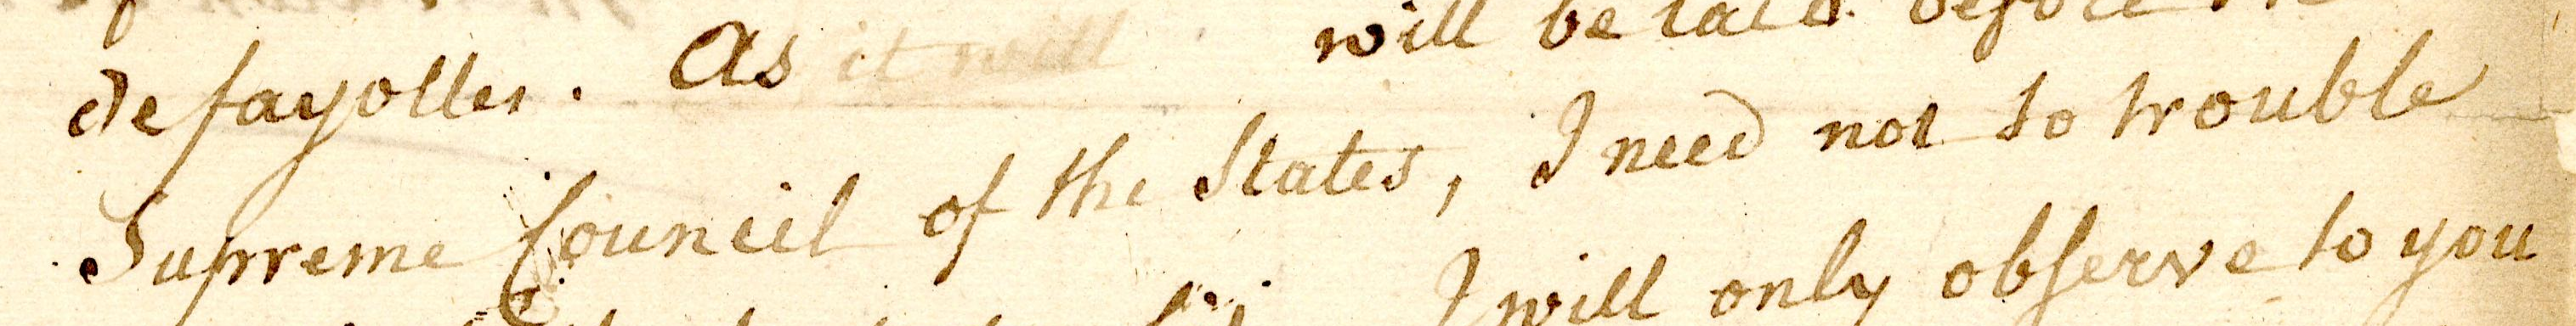Supreme Council of the States, I need not to trouble
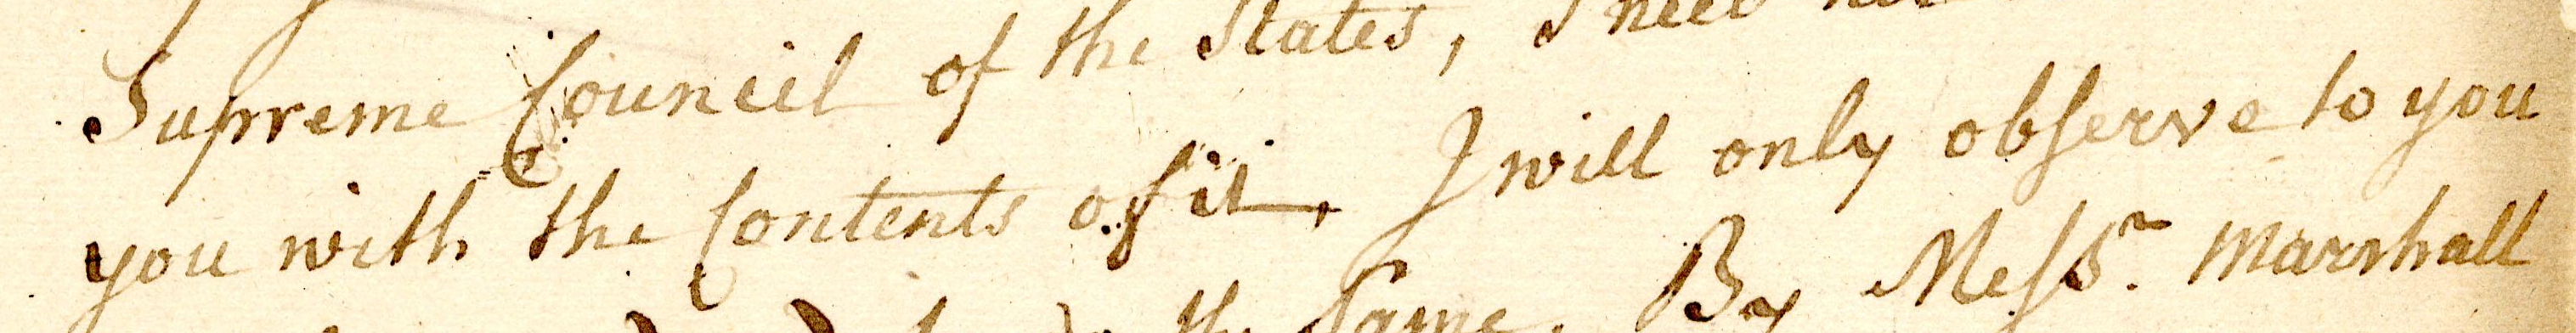you with the Contents of it. I will only observe to you
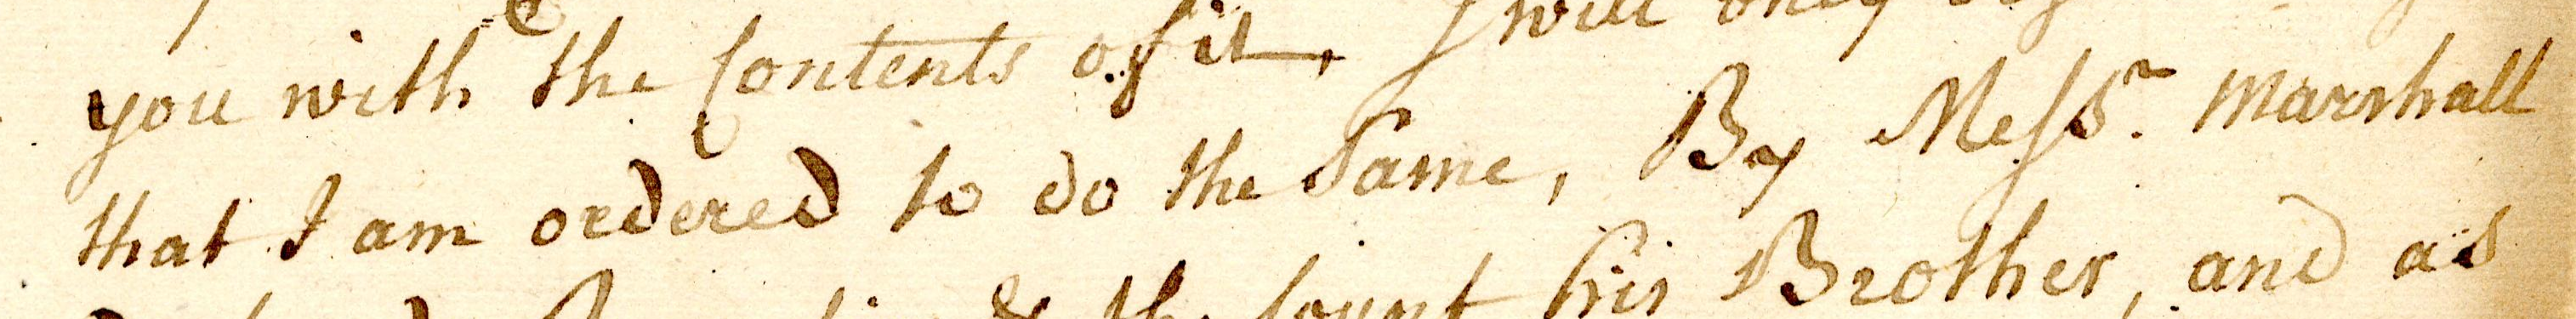that I am ordered to do the Same, By Mess^r. Marshall
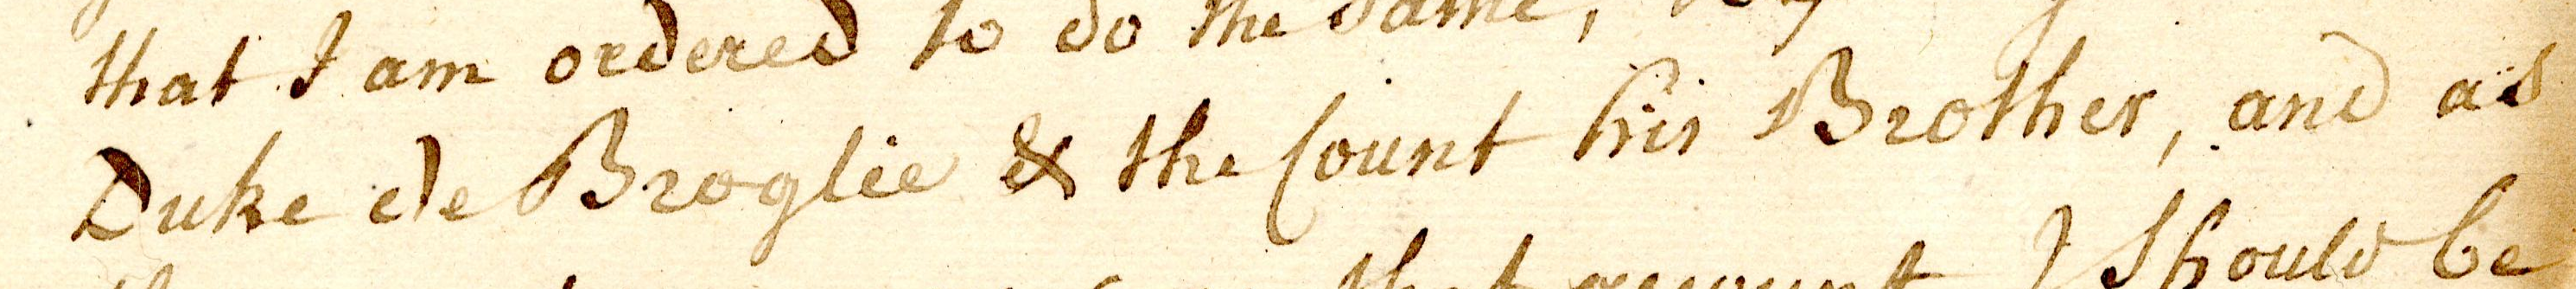Duke de Broglie & the Count his Brother, and as
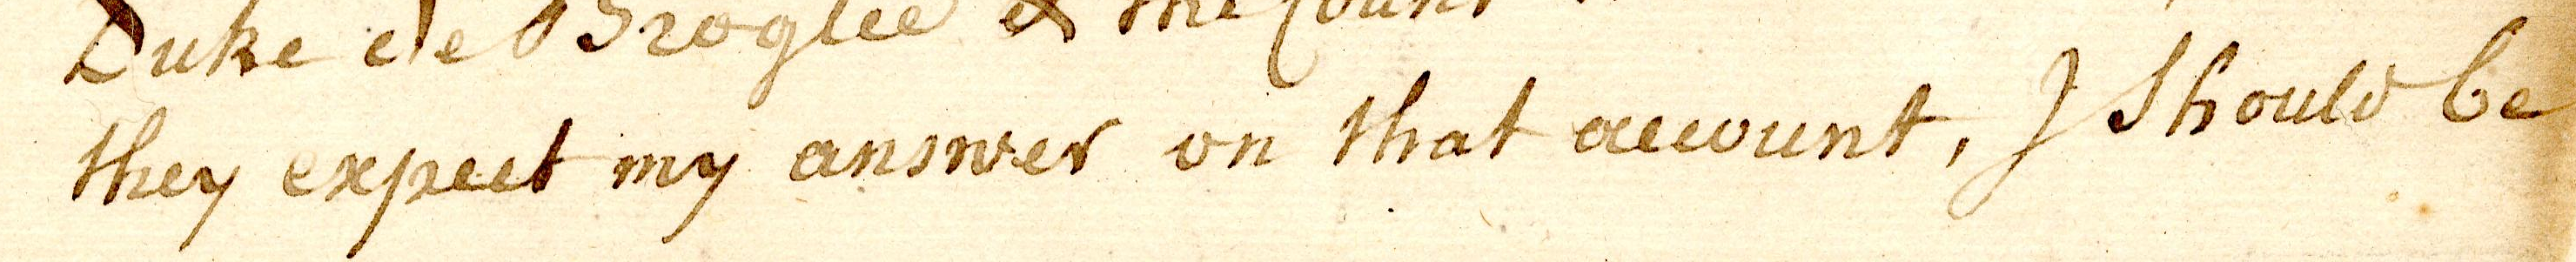they expect my answer on that account, I Should be
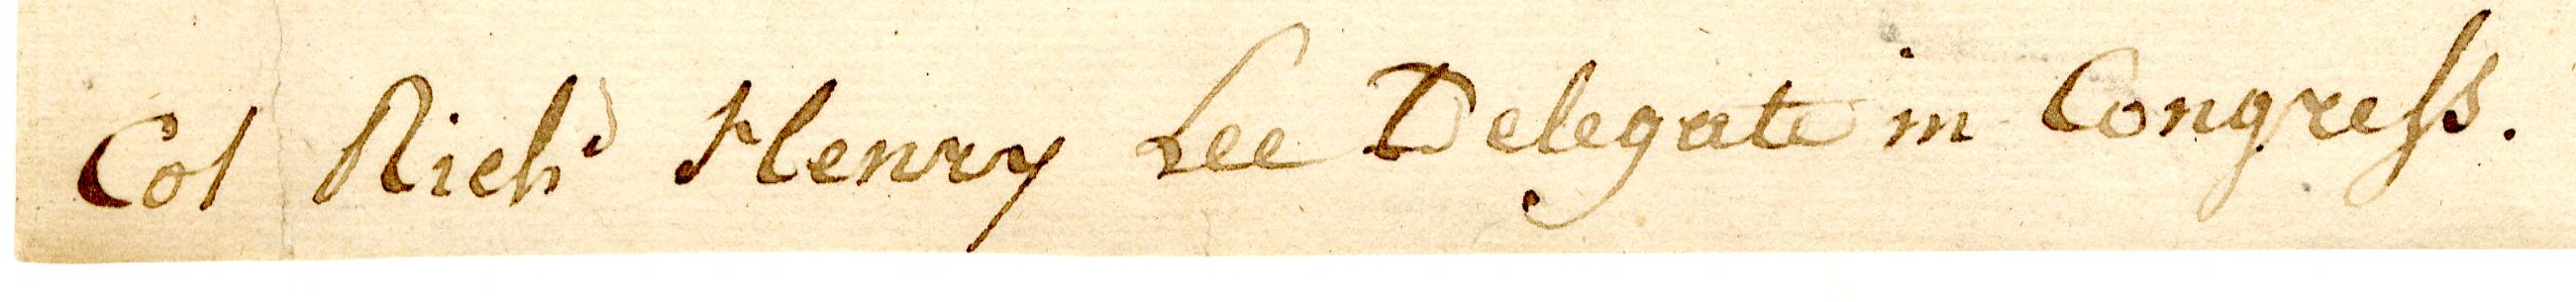Col Rich^d. Henry Lee Delegate in Congress.
